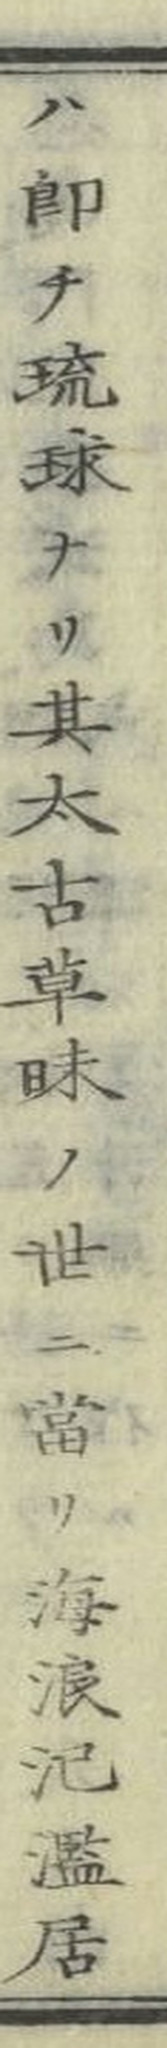ハ即チ琉球ナリ其太古草昧ノ世ニ當リ海浪氾濫居
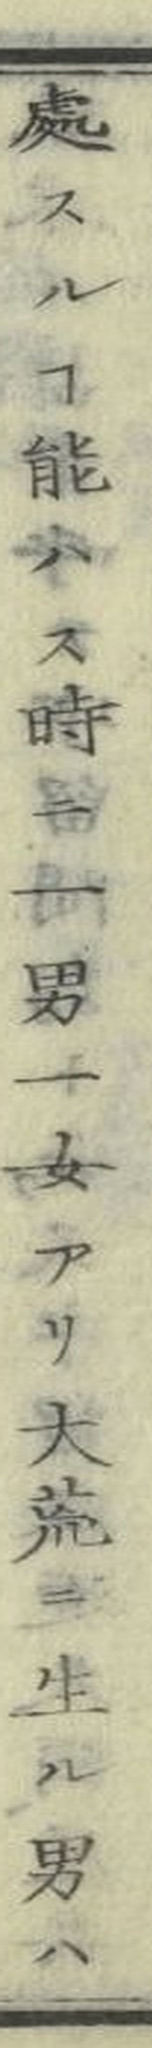處スルコト能ハス時ニ一男一女アリ大ニ生ル男ハ
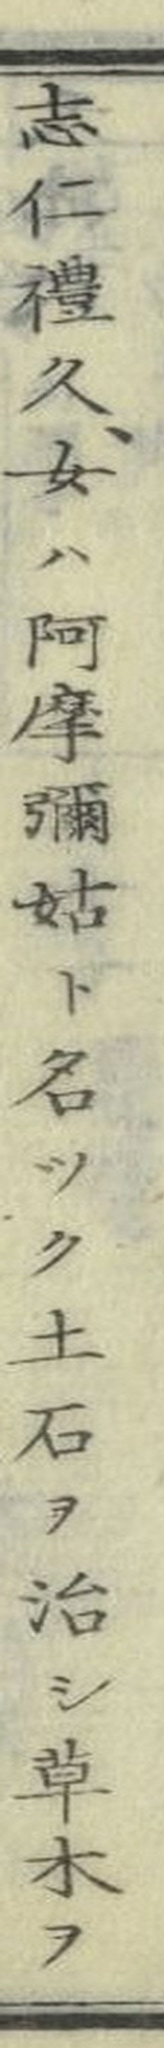志仁禮久、女ハ阿摩彌姑ト名ツク土石ヲ治シ草木ヲ
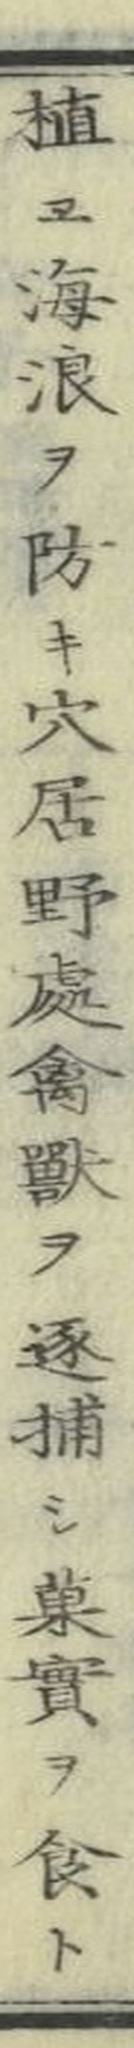植エ海浪ヲ防キ穴居野處禽獸ヲ逐捕シ菓實ヲ食ト
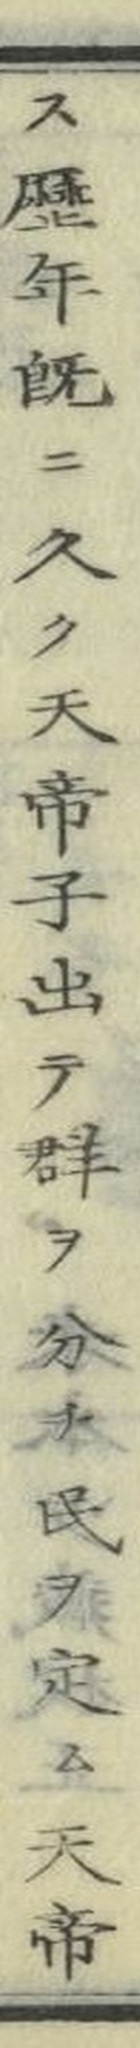ス歷年既ニ久ク天帝子出テ群ヲ分チ民ヲ定ム天帝
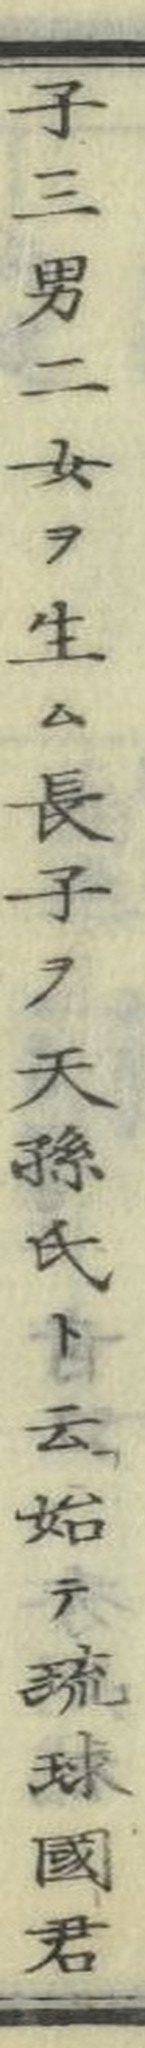子三男二女ヲ生ム長子ヲ天孫氏ト云始テ琉球國君
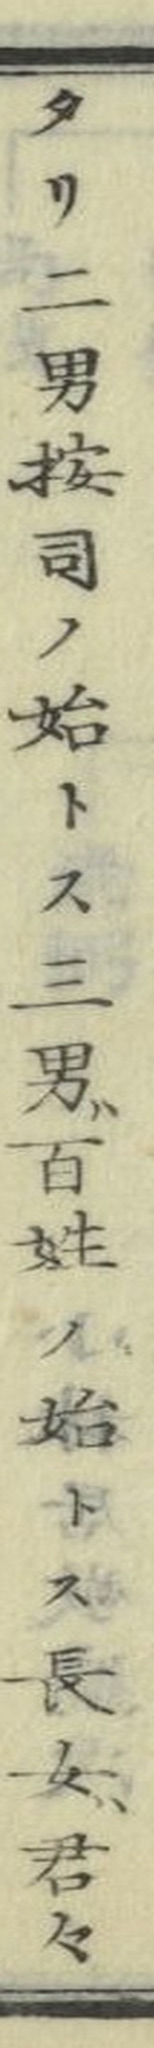タリ二男按司ノ始トス三男百姓ノ始トス長女、君々
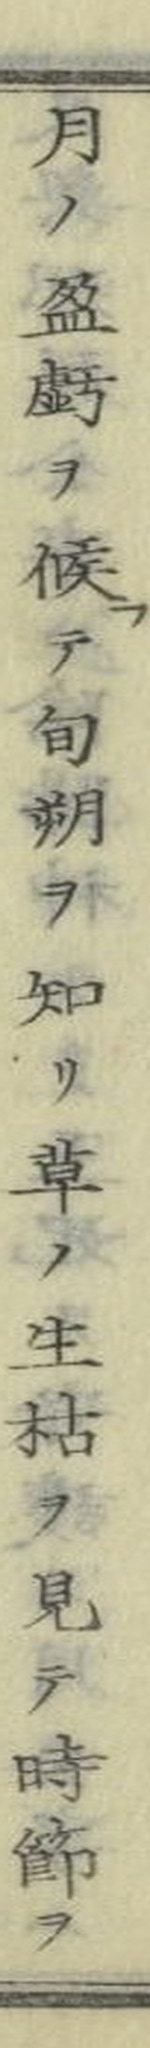月ノ盈虧ヲ候旬朔ヲ知リ草ノ生枯ヲ枯テ時節ヲ
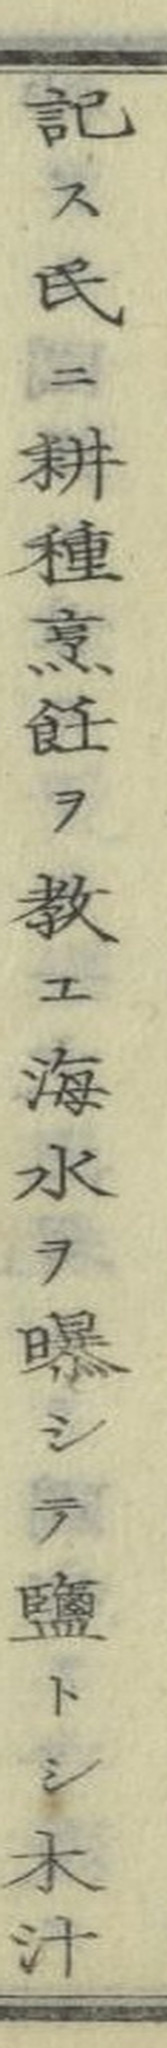記ス民ニ耕種烹飪ヲ教エ海水ヲ曝シテ鹽トシ木汁
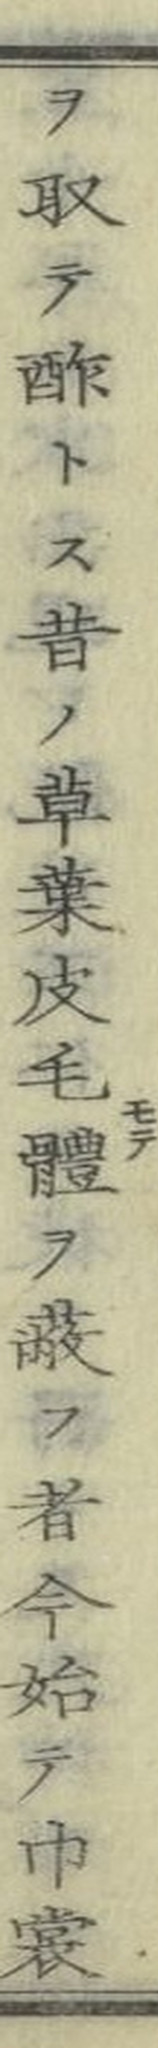ヲ取テ酢トス昔ノ草葉皮毛體ヲ蔽フ者今始テ巾裳
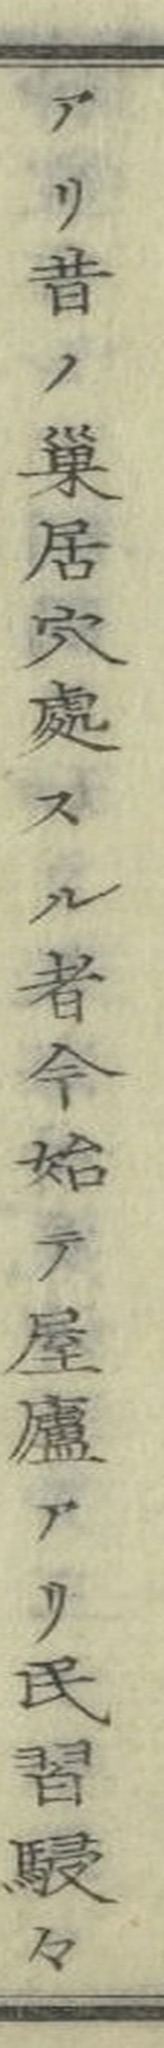アリ昔ノ巢居穴處スル者今始テ屋廬アリ民習駸々
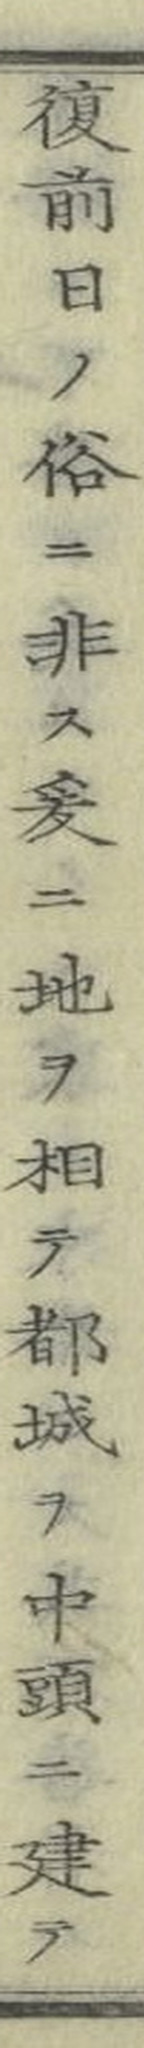復前日ノ俗ニ非ス爰ニ地ヲ相テ都城ヲ中頭ニ建テ
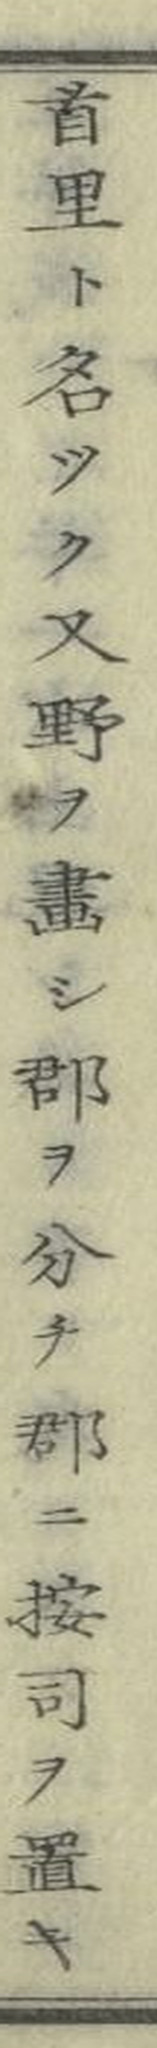首里ト名ツク又野ヲ畵シ郡ヲ分チ郡ニ按司ヲ置キ
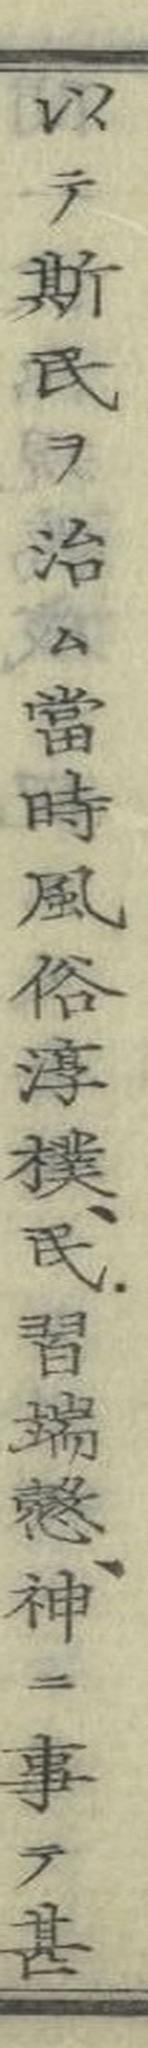以テ斯民ヲ治ム當時風俗淳樸、民習端、神ニ事テ甚
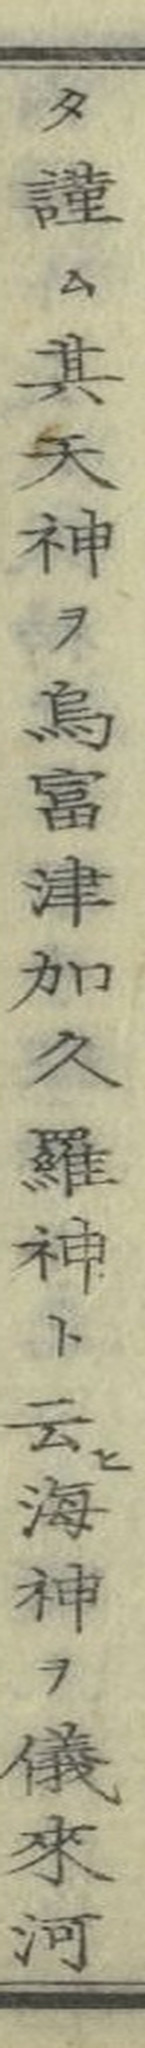タ謹ム其天神ヲ烏富津加久羅神ト云海神ヲ儀來河

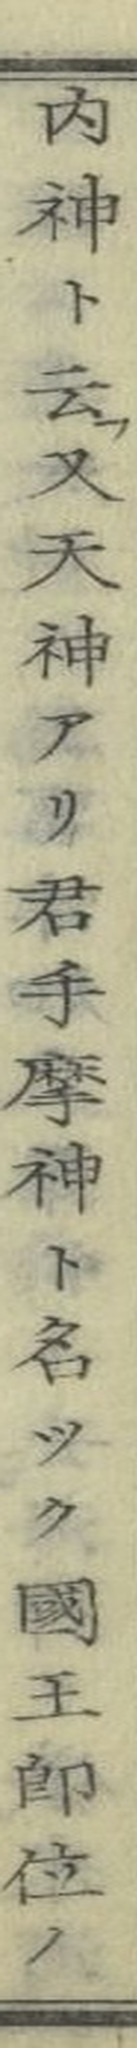内神ト云又天神アリ君手摩神ト名ツク國王即位ノ
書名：琉球藩史 一之巻
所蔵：University of the Ryukyus Library
